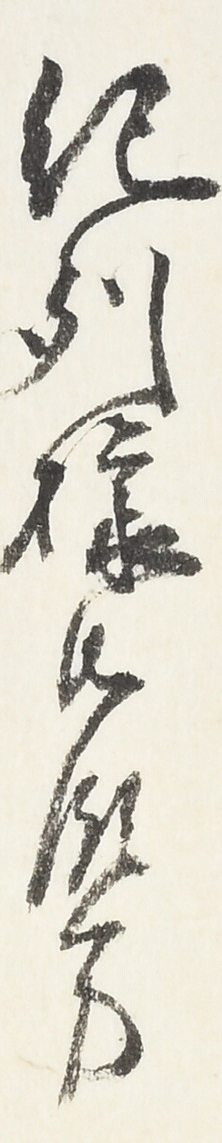紀州様御領分
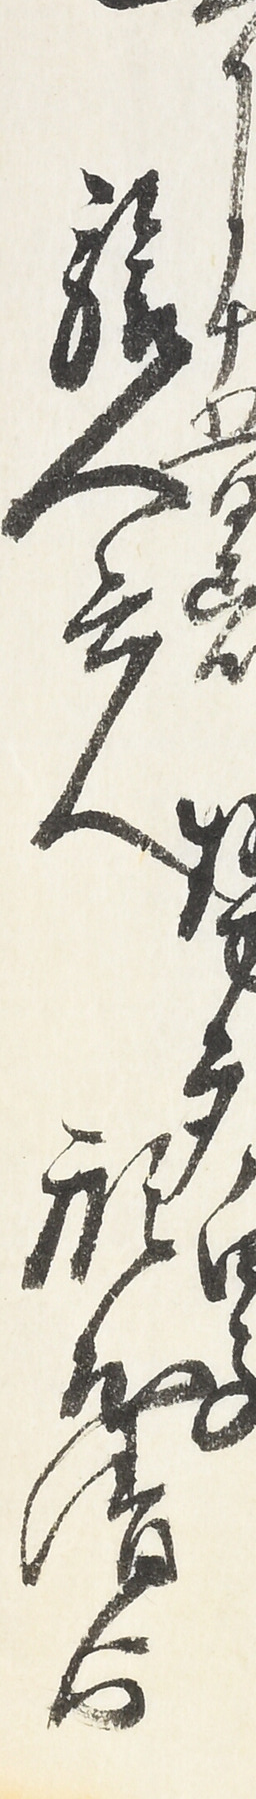一旅人壱人形屋清衛門
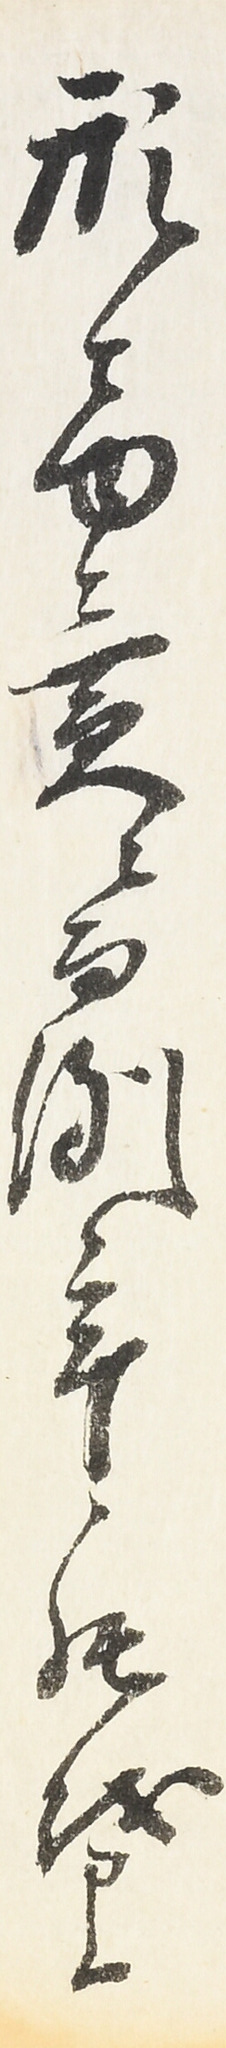形商売ニ而例年罷越申候
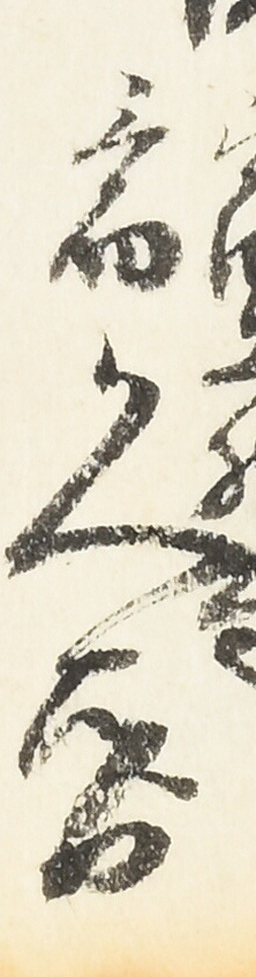宿久右衛門
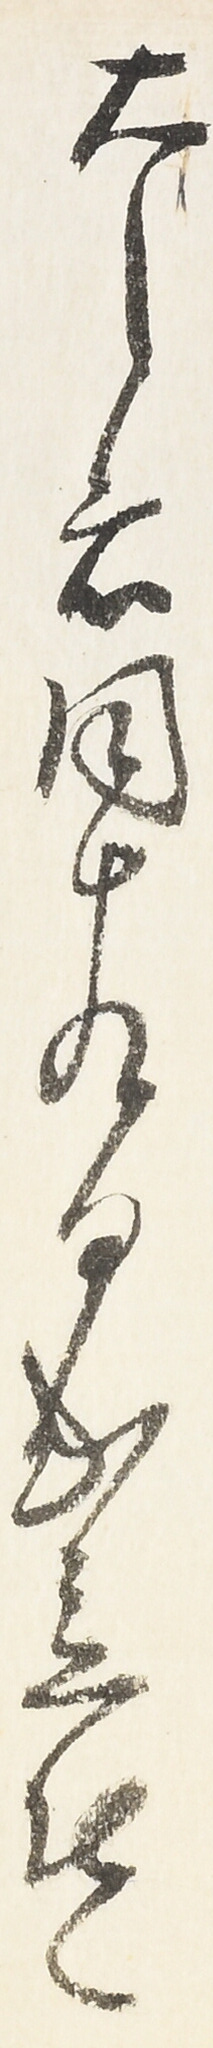右之者同十九日出立仕候
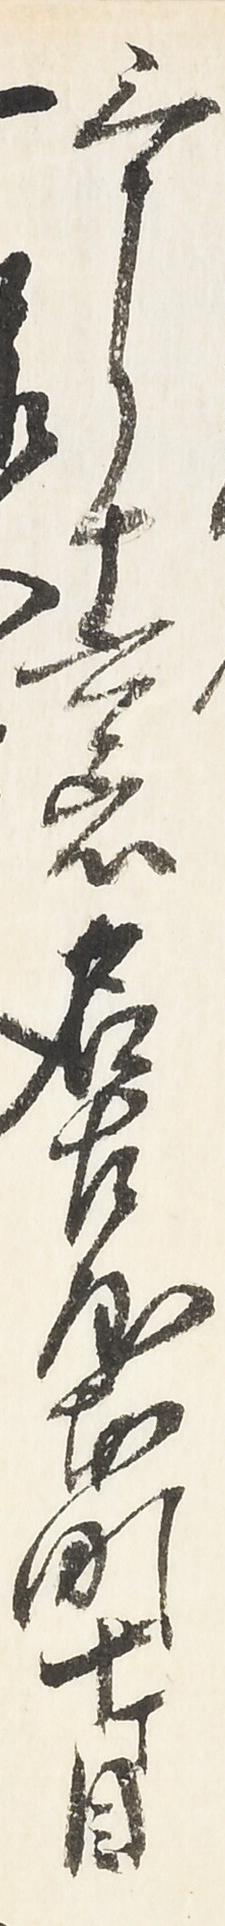三月十六日着名古屋本町十丁目
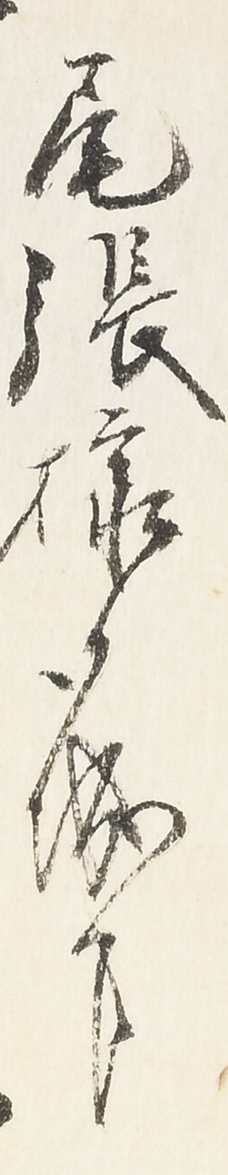尾張様御城下
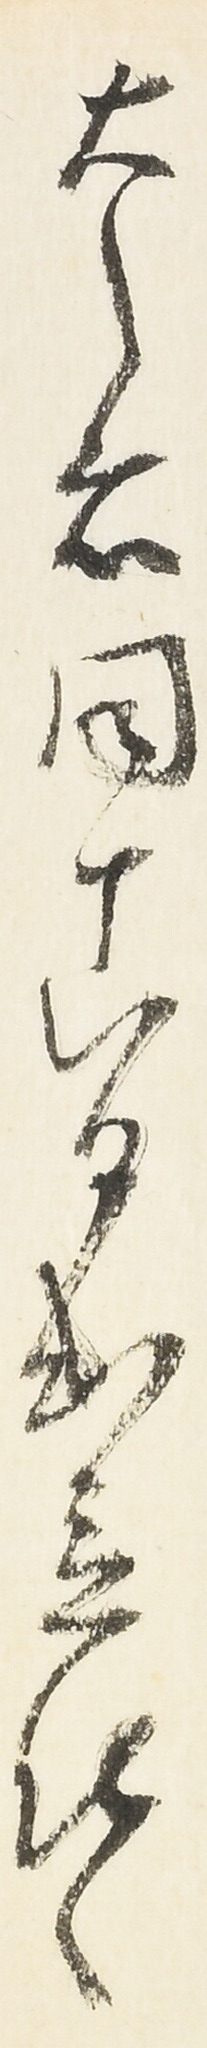右之者同十八日出立仕候
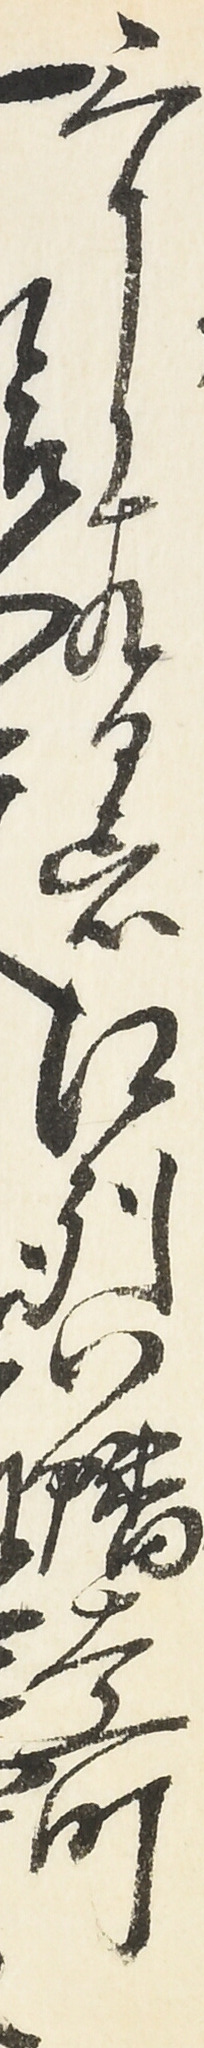三月十九日着江州八幡大工町
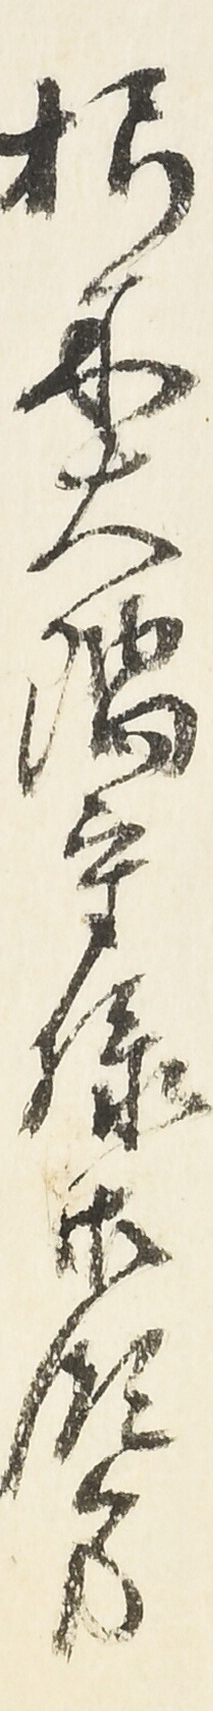朽木大隅守様御領分
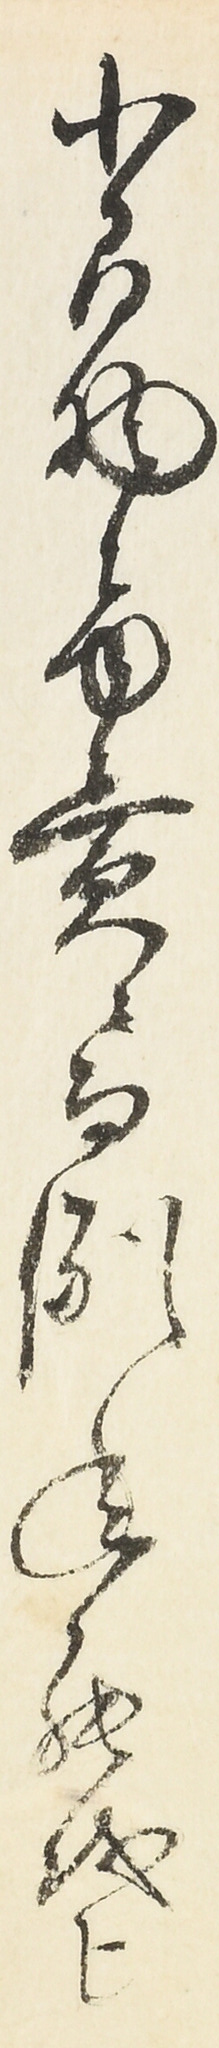小間物商売ニ而例年罷越申候
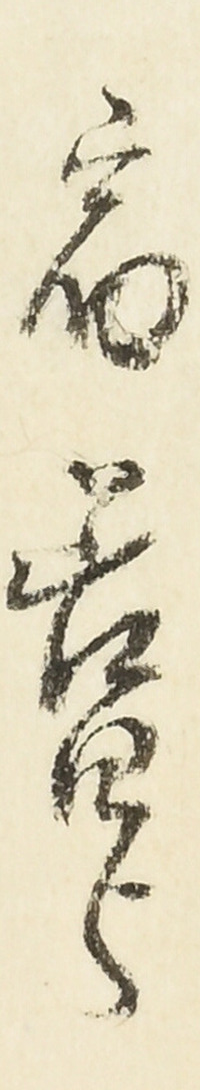宿善四郎

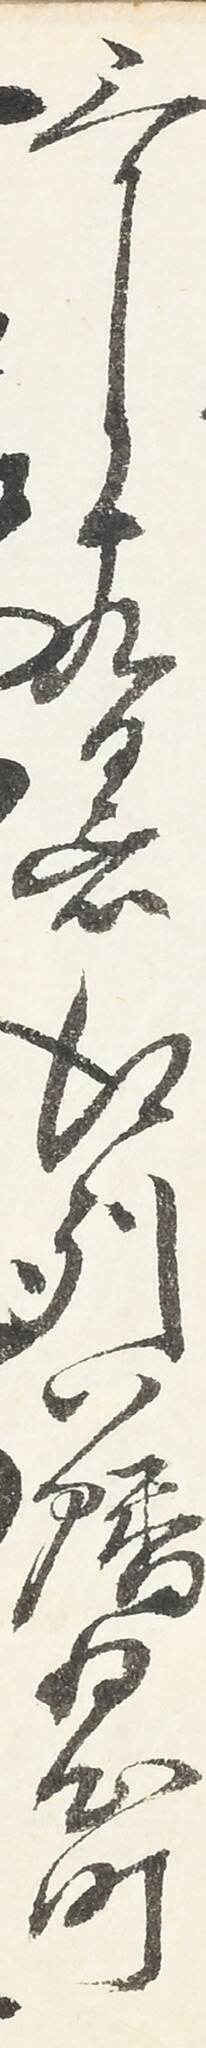三月十九日着江州八幡為心町
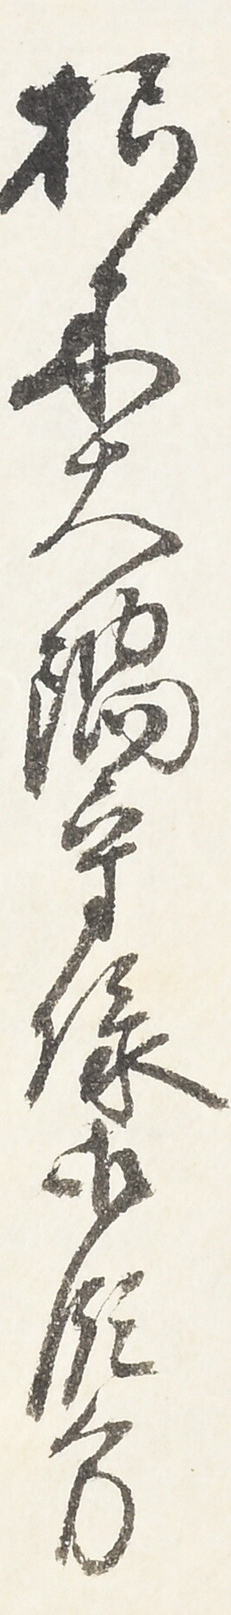朽木大隅守様御領分
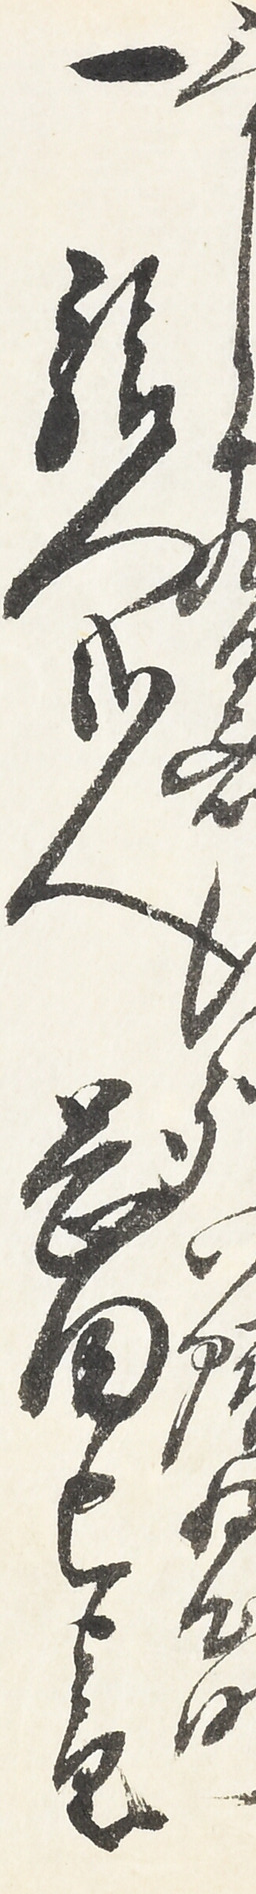一旅人弐人岡田与兵衛
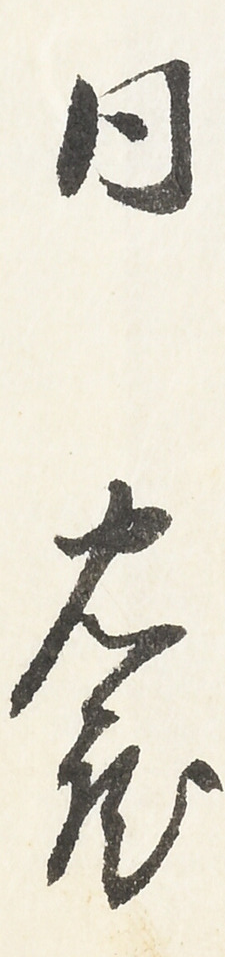同忠蔵
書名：町中旅人泊控帳
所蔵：伊那市立高遠町図書館・合同会社AMANE
